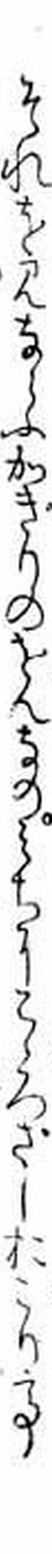それをみならふかぎりのをんなの。みちにこころざしおこりて
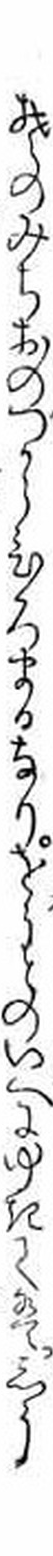そのみちおのづからひろまるなり。をうとのいへにゆきては。しう
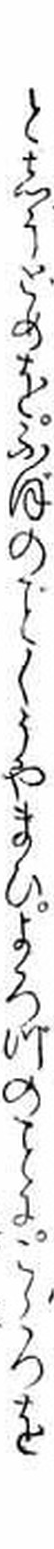としうとめを。ふぼのごとくうやまひ。よろづのことに。こゝろを
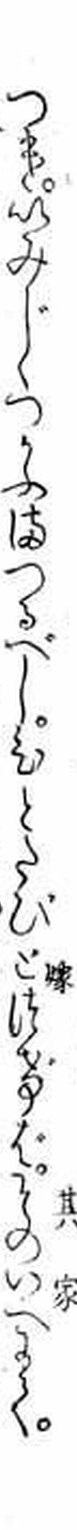つけ。いみじくつかふまつるべし。ひとたびとつげば。そのいへにて。
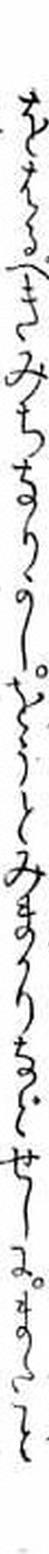をはるべきみちなりかし。をうとみまかりなどせしに。またこと
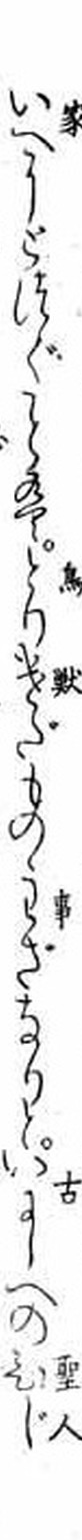いへにとつぐことは。とりけだものゝわざなりと。いにしへのひじ
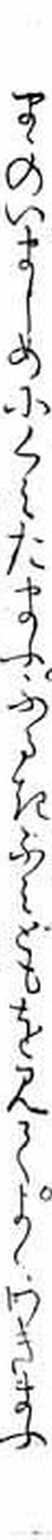りのいましめにくみたまふ。ふるきふみどもを見て。よくわきまふ
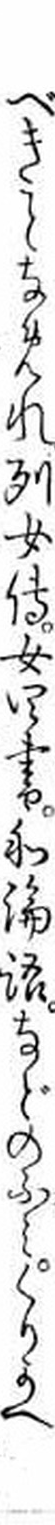べきとなめれ。列女伝。女四書。和論語。などのふみ。くりかへ
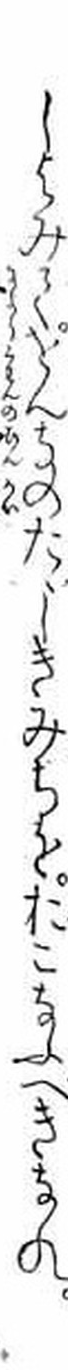しよみて。をんなのただしきみちを。おこなふべきなれ。
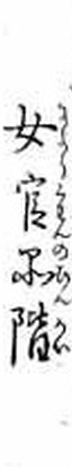女官品階
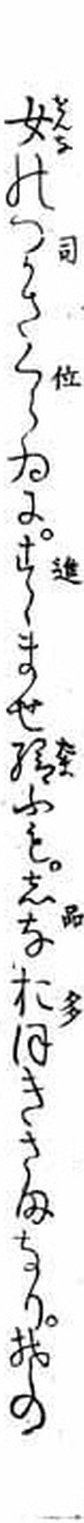女のつかさくらゐに。すすませ給ふも。しなおほきさまなり。その

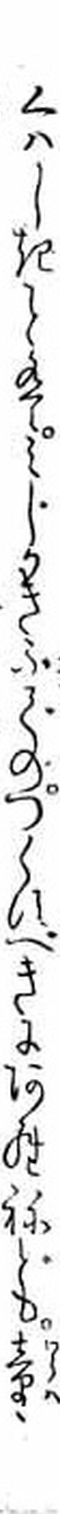くはしきことは。みじかきふでの。つくすべきにあらねども。童
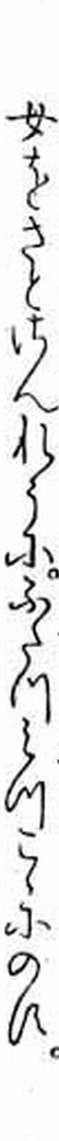女をさとさんれうに。ふたつみつこゝにのす。
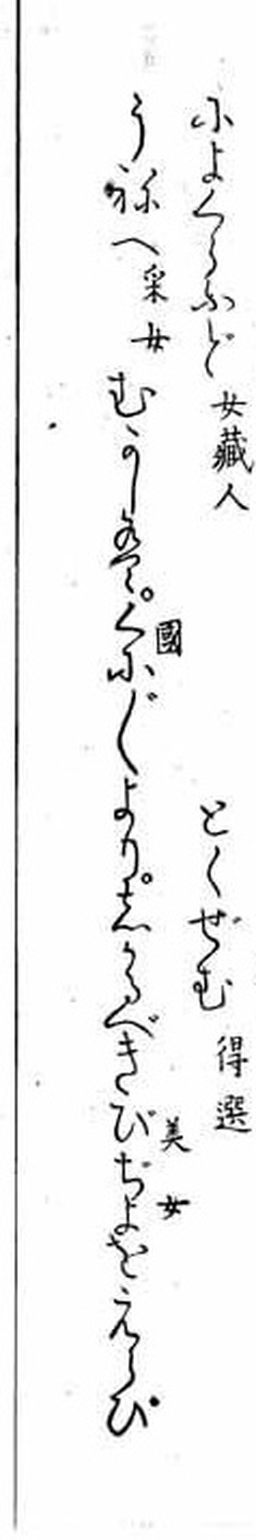うねへ采女むかしは。くに〴〵より。しかるべきびぢよをえらび
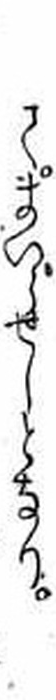て。まいらせしとなり。
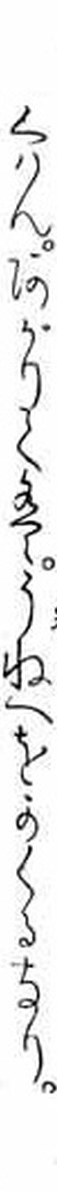くはん。あがりては。うねへをかくるなり。
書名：女学範
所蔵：東京学芸大学教育コンテンツアーカイブ
